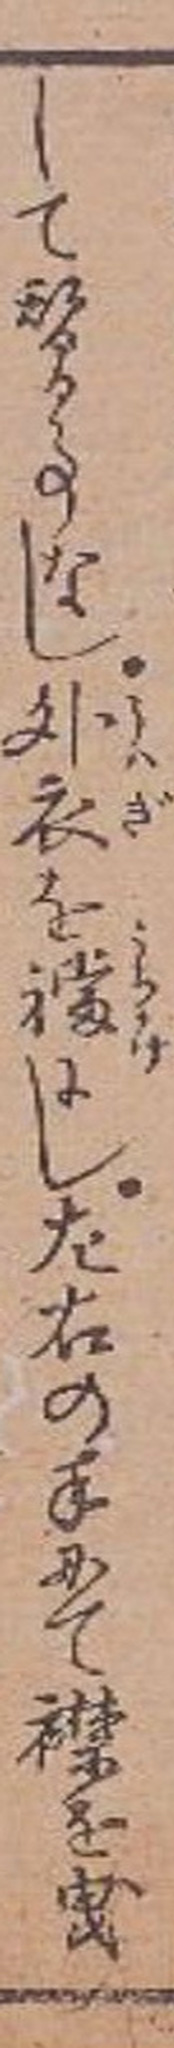して替る事なし•外衣を襠にし•左右の手にて襟を曳
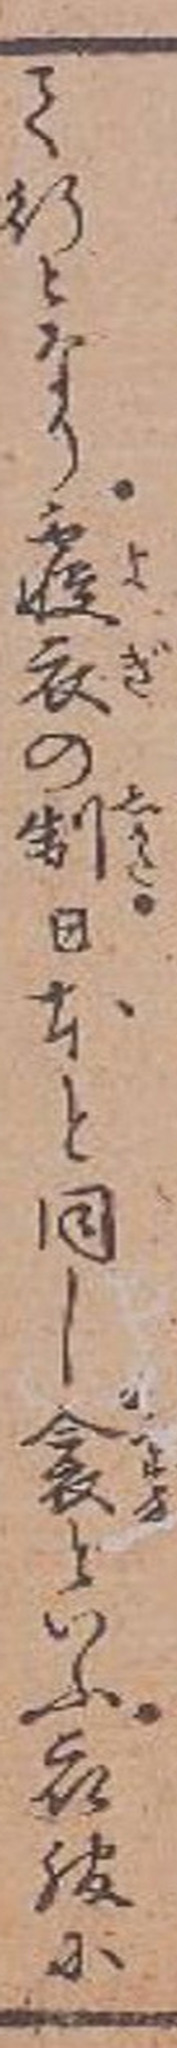て行となり•寝衣の制•日本と同し•衾といふ•衣服に

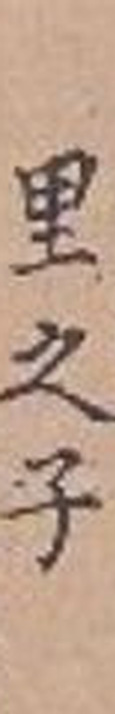里之子
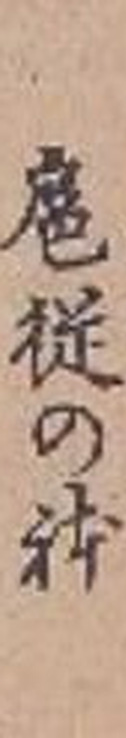扈従の体
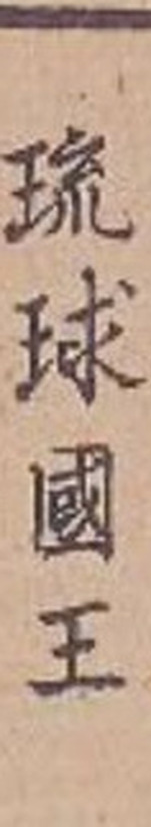琉球国王

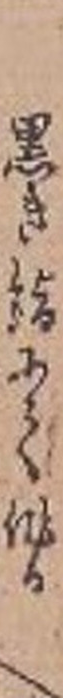黒き絹にて作る
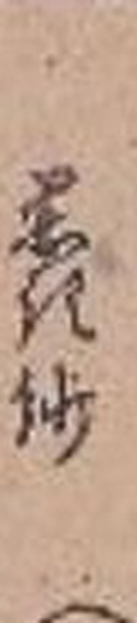黒き紗
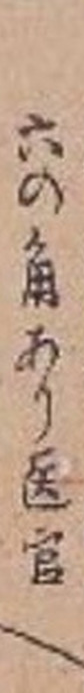六の角あり医官
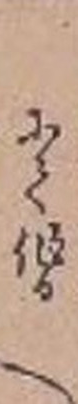にて作る
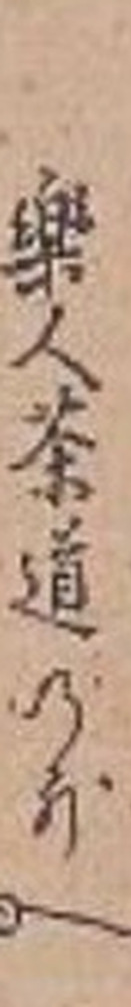楽人茶道の外
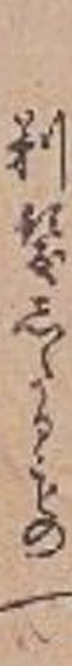剃髪したるもの
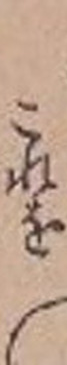これを
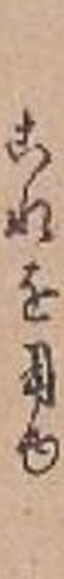これを用ゆ
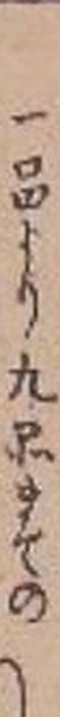一品より九品まての
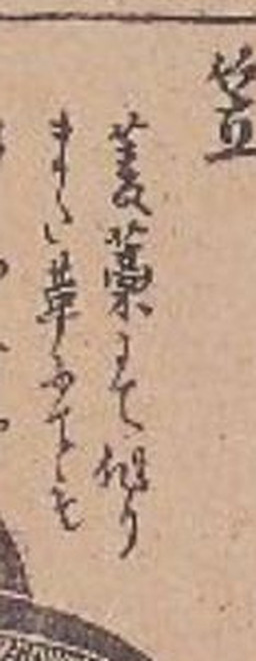麦藁にて作り
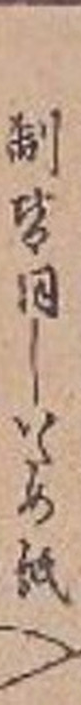制皆同しいため紙
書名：琉球談
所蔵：University of the Ryukyus Library
